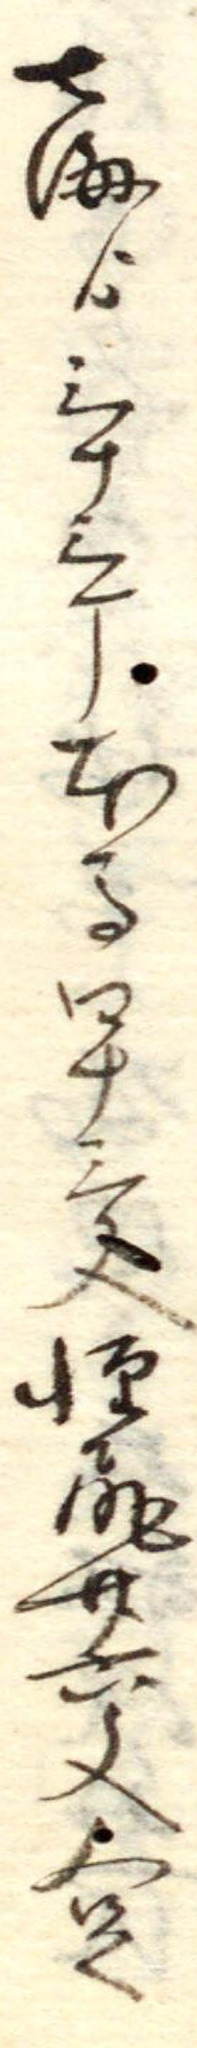七海ゟ三十三丁本馬四十三文軽尻廿六文人足

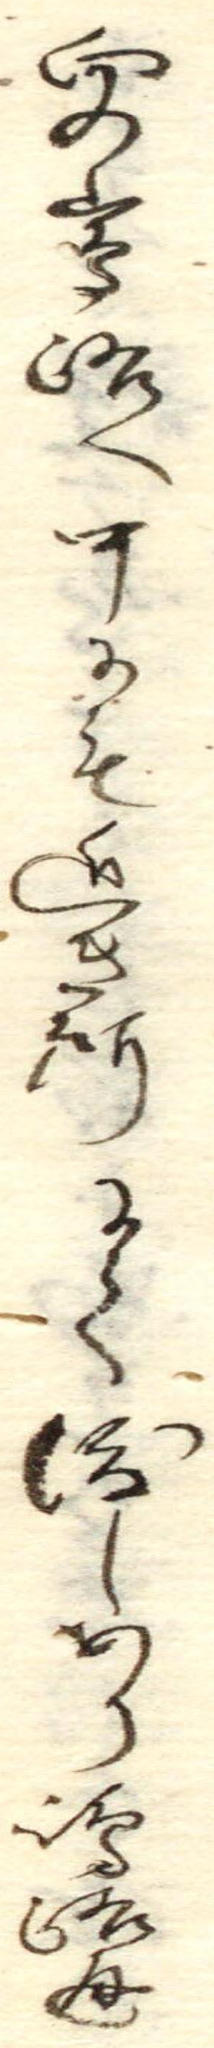向の嶌路へ中にも近き所にて渡しあり嶋路通
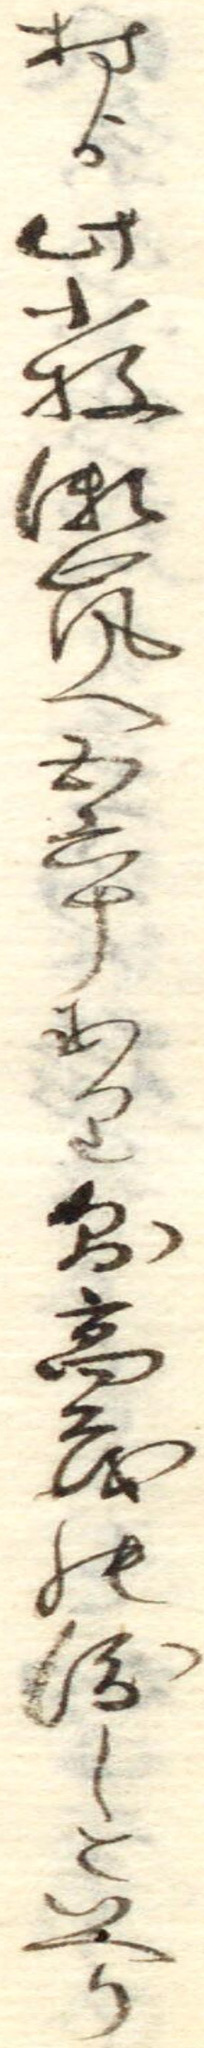村ゟ此小牧瀬嵐へ五六丁あり則高茂の渡しといへり
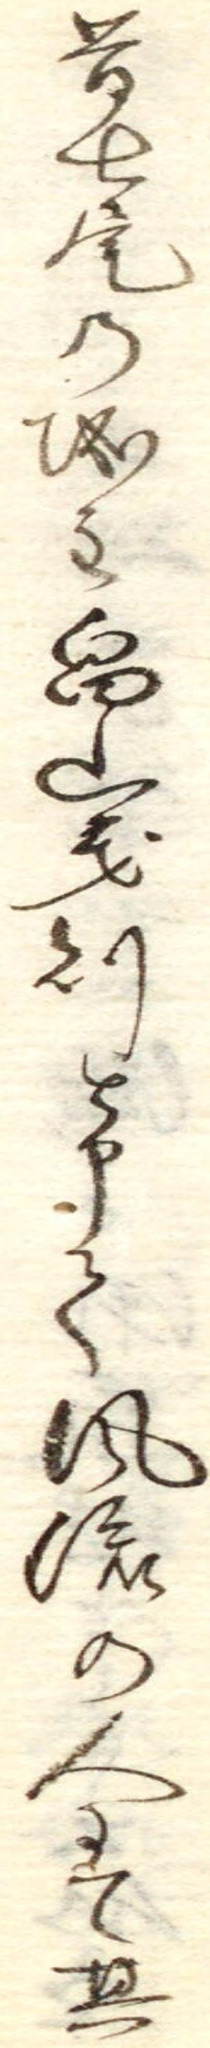昔七尾の城主畠山義則と申て風流の人にて其
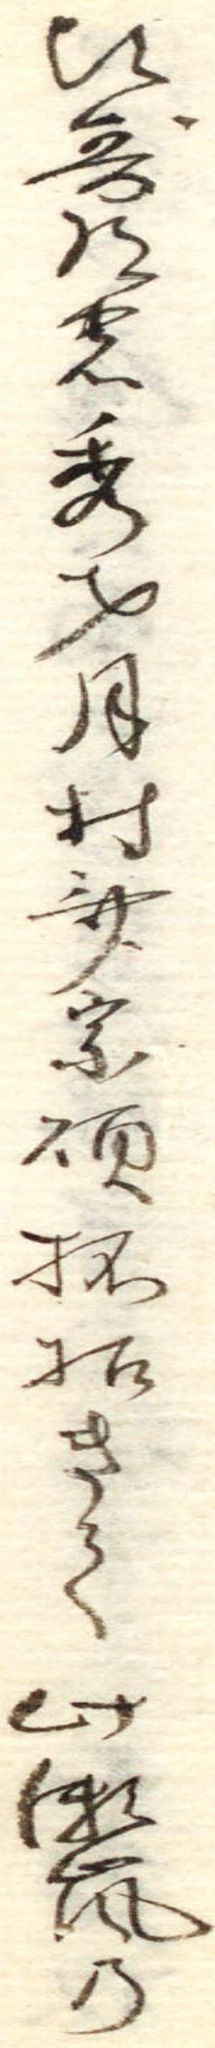頃歌道の秀才月村斎宗碩抔招きて此瀬嵐の
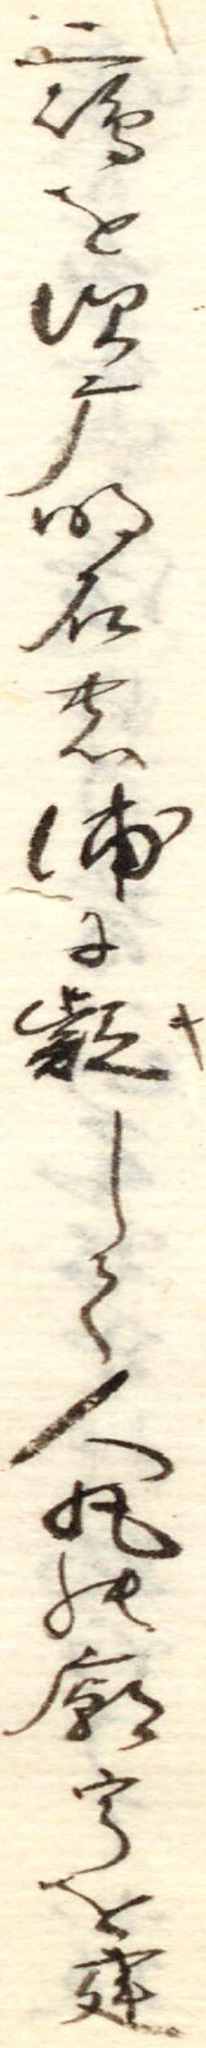二嶋を須磨の明石の浦に疑して人丸の廓宇を建
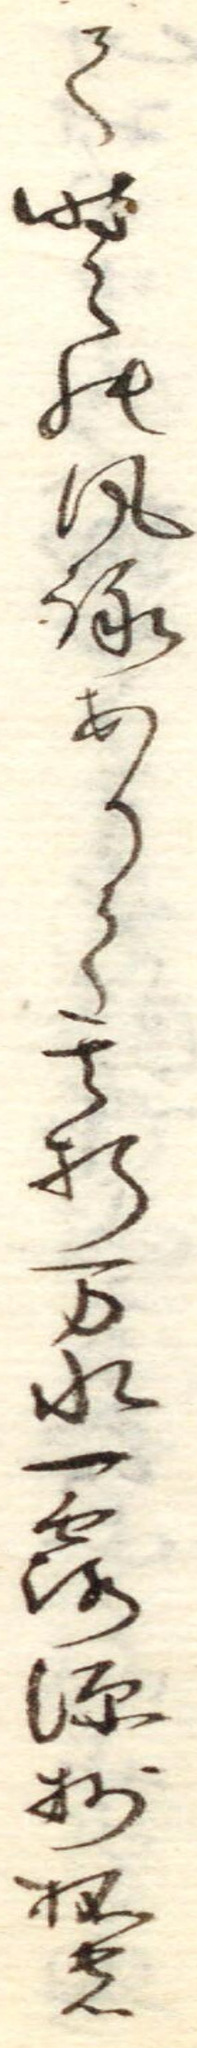て時々の風詠ありて其折万水一露深抄抔の
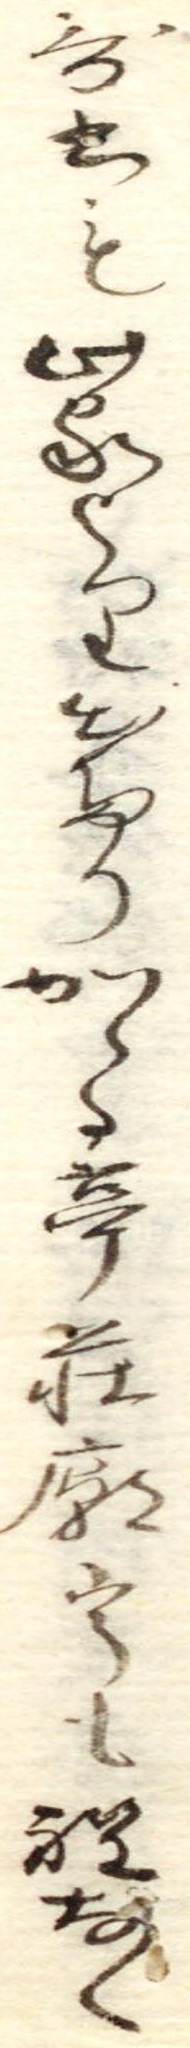歌書も此家より出たりかゝる亭荘廓宇も程なく
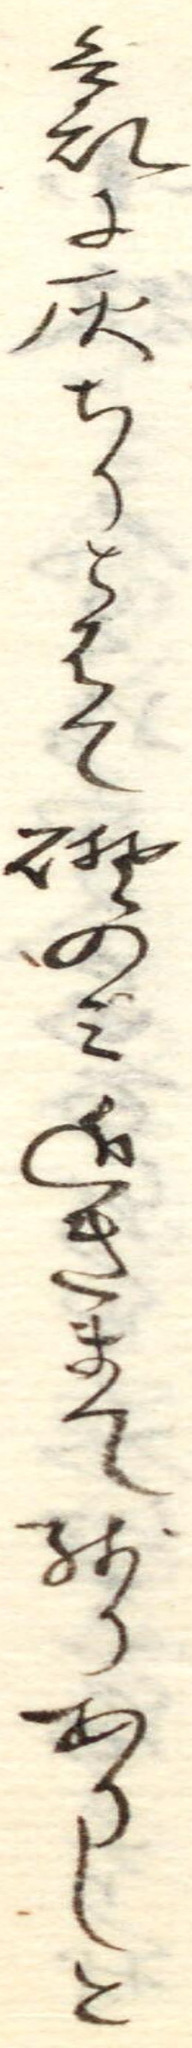兵乱に灰ちりとはて礎のみ近きまて残りありしと
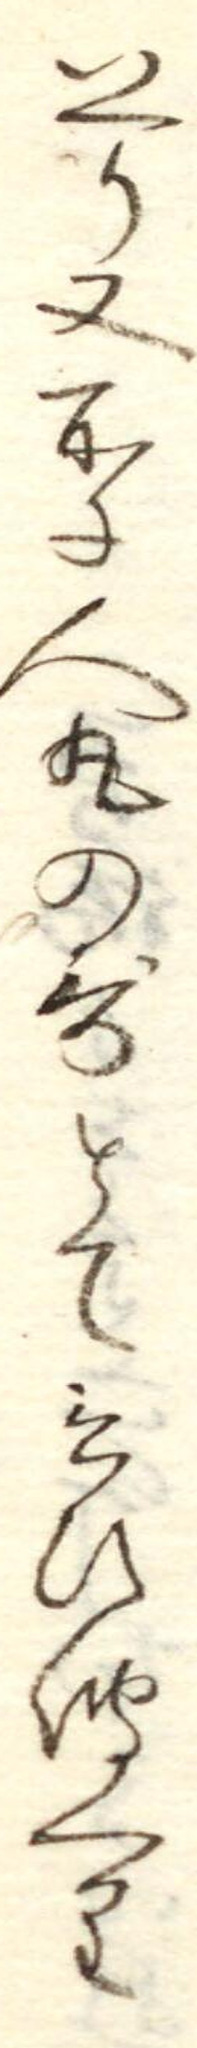いへり又所に人丸の哥とて云ひ伝へり
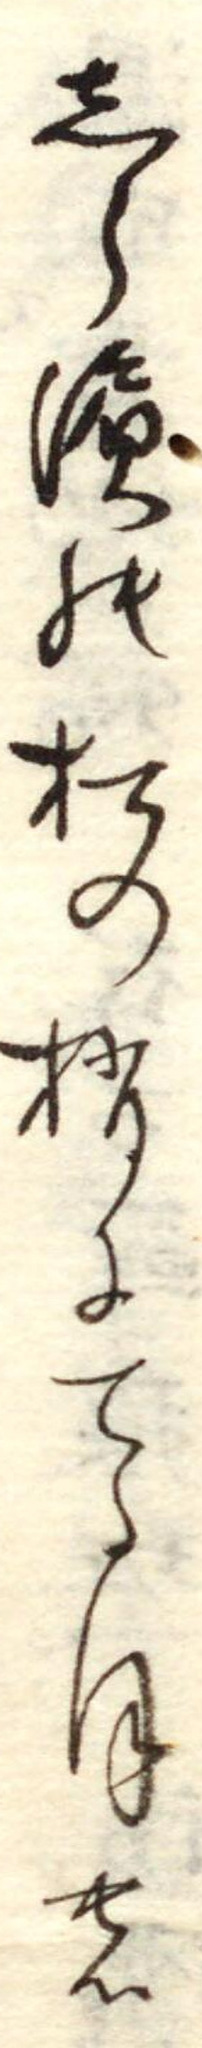しら浜の松の梢にてる月の
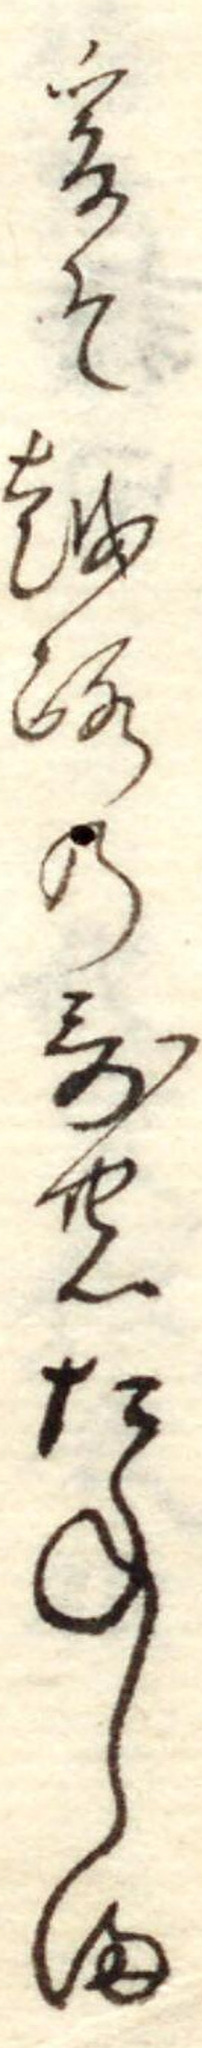爰そ越路の哥のたねしま
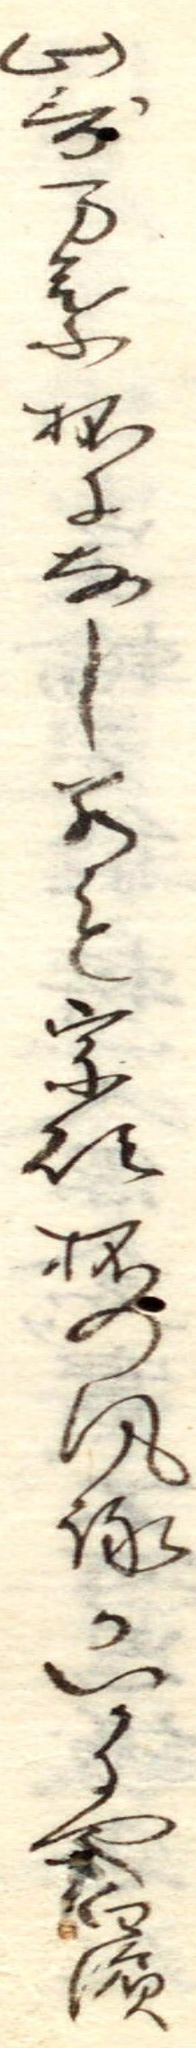此哥万葉抔になし若も宗碩抔の風栄詠かいかにや白浜
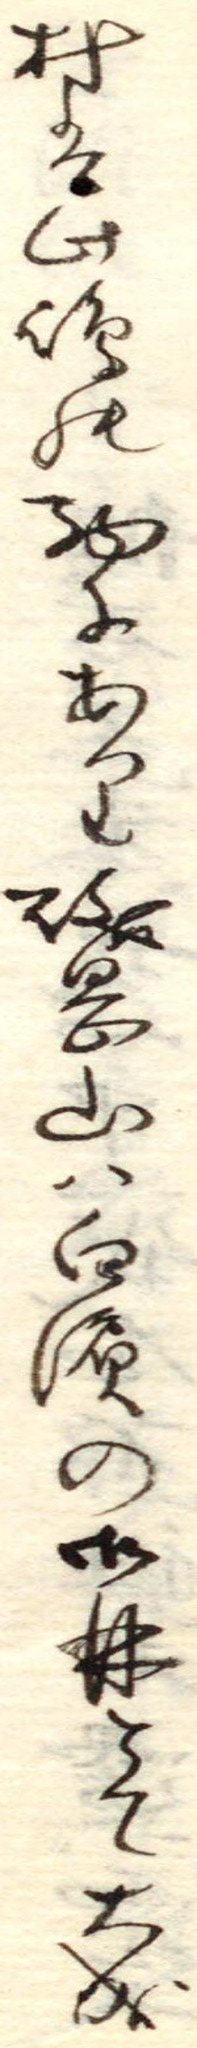村は此嶋の西にあり礒岡山は白浜の御林とて大成
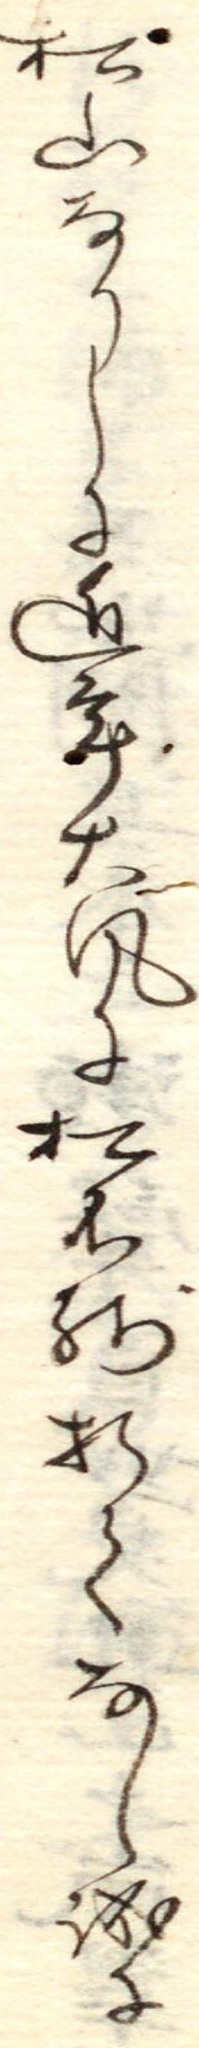松山なりしに近年大風に松不残折てなし誠に
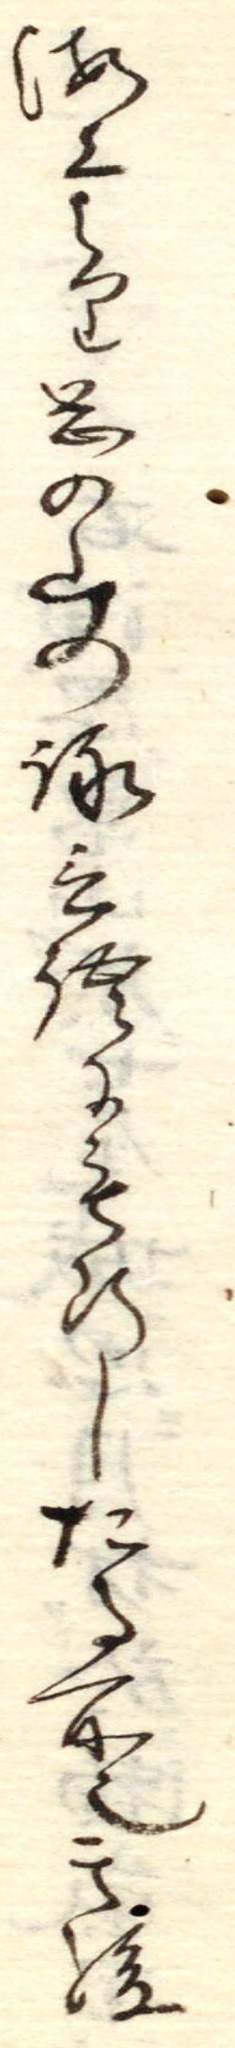海上より岡の上の詠言語にも断したる所也其後
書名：能登名跡誌
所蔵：Ishikawa Prefectural Library
